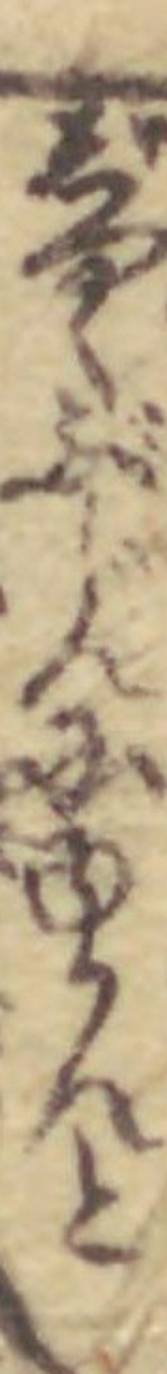じやくぶじんにゆかんと
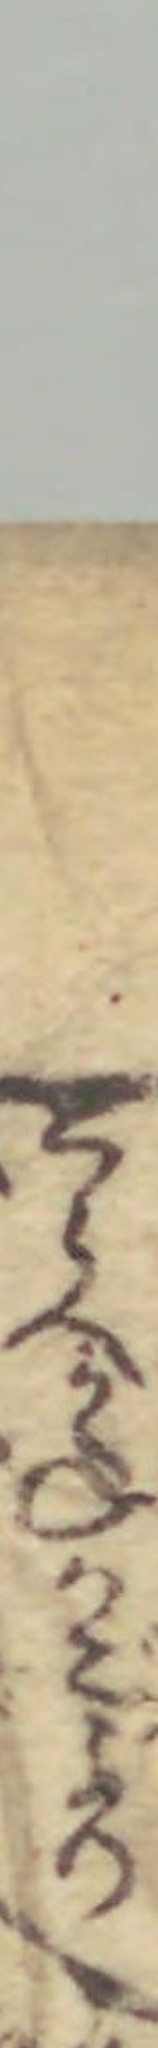こらへかねかごより
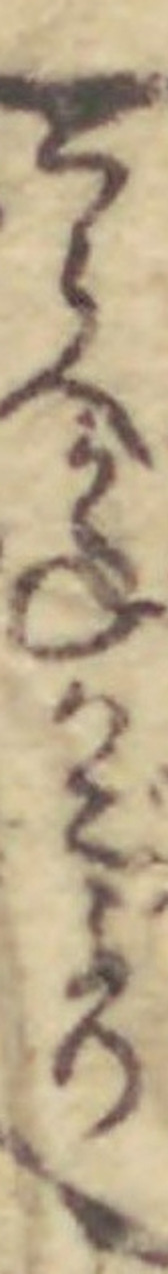こらへかねかごより
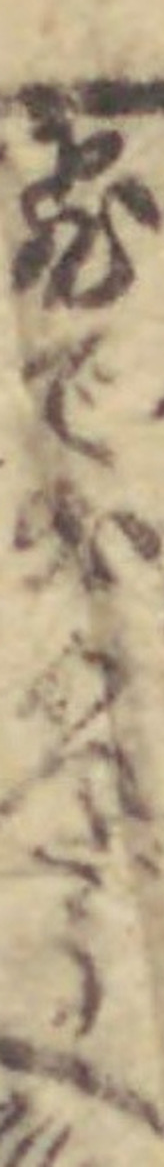飛で出めんだう
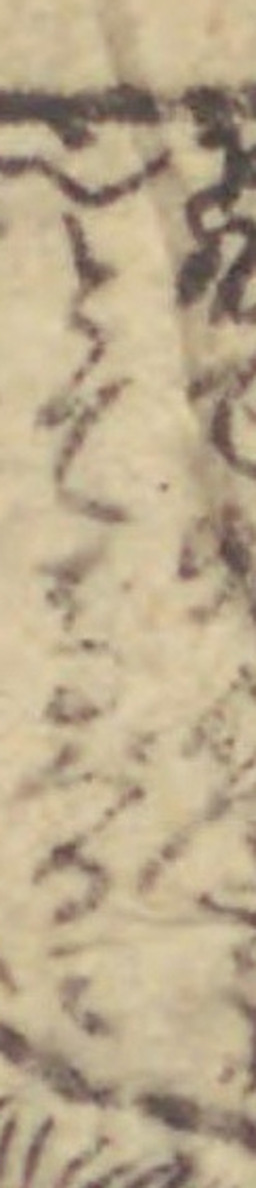也とて馬ぐるみ

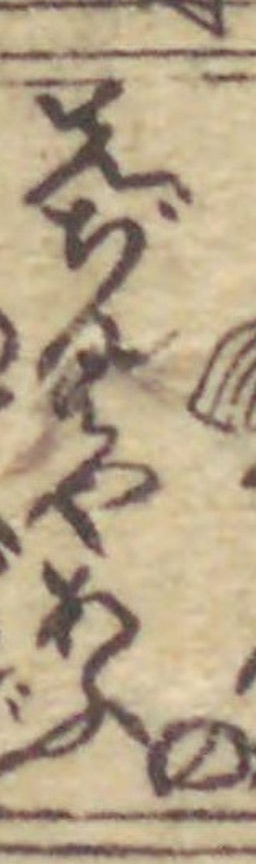先ぢんはやあふ
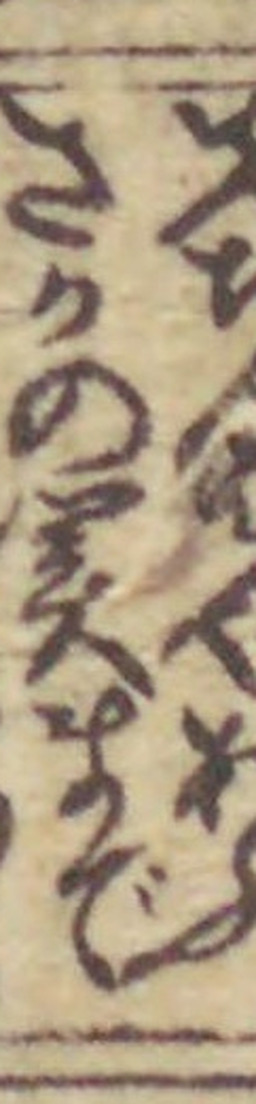さかの関まで
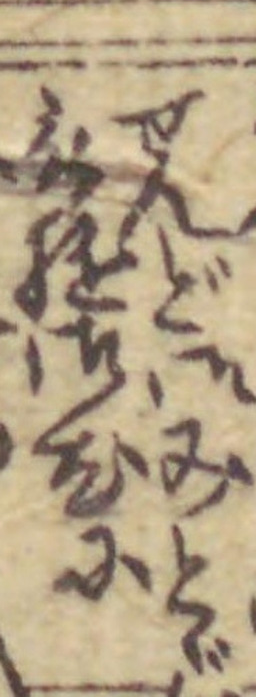被遊御心に
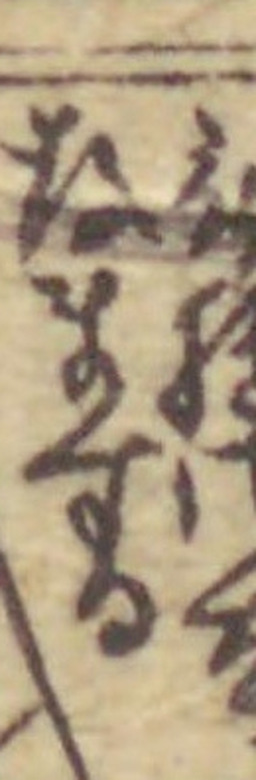存まする
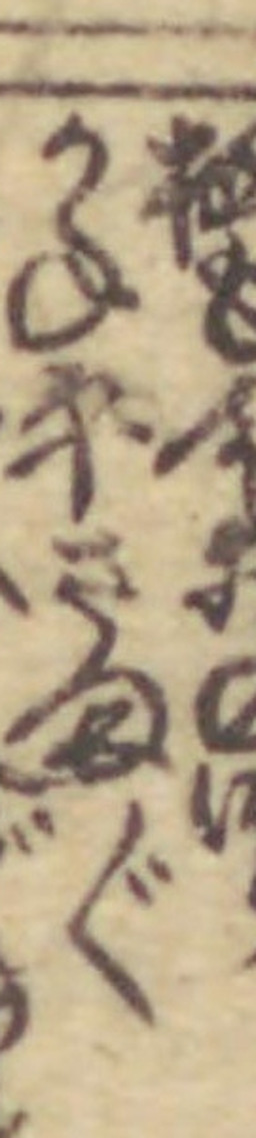かね平さま〴〵
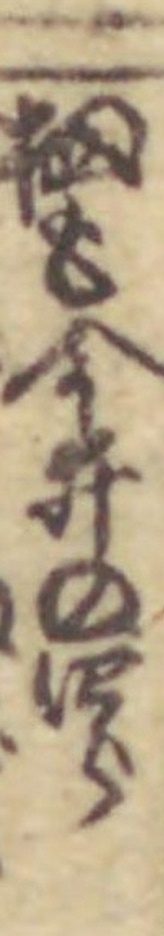扨も今井の四郎
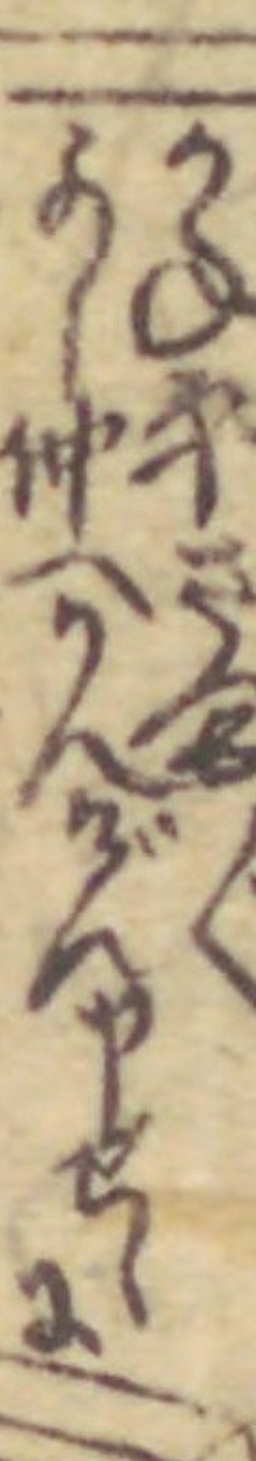よし仲へかんげん申せしに
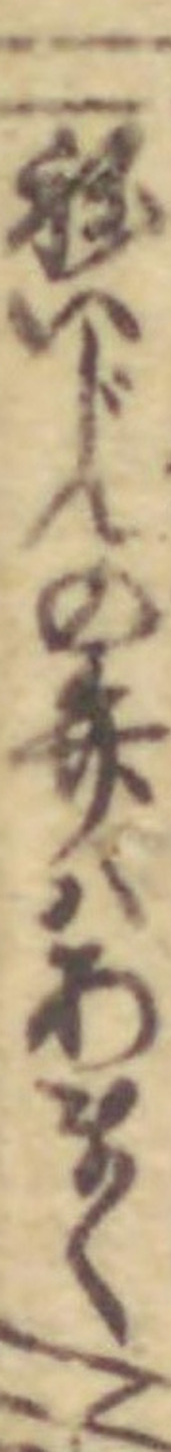ねいじんの弁はあまく
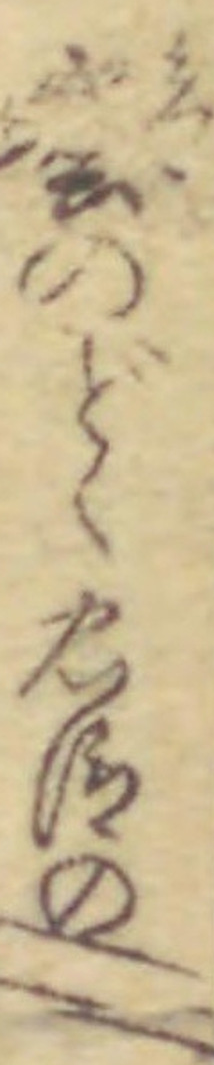蜜のごとく忠臣の
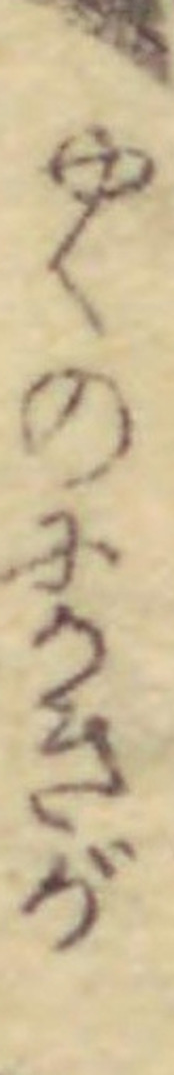やくのにかきが
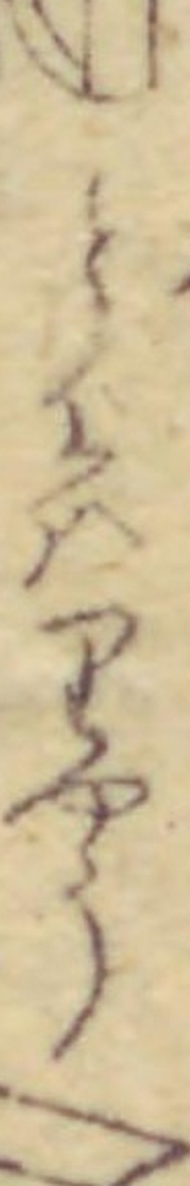ことははりやう
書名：朝比奈草摺実記 2巻
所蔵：国立国会図書館 National Diet Library, JAPAN
